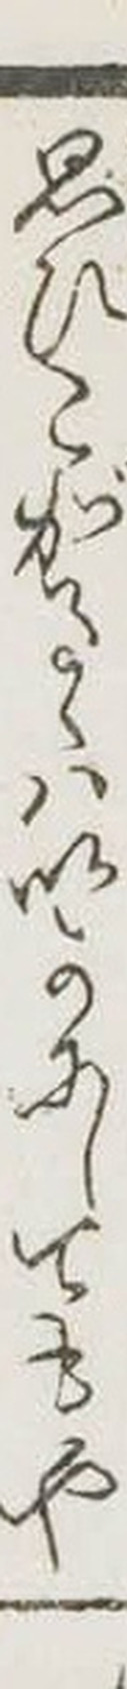思ひこがるゝはいかにしてもや
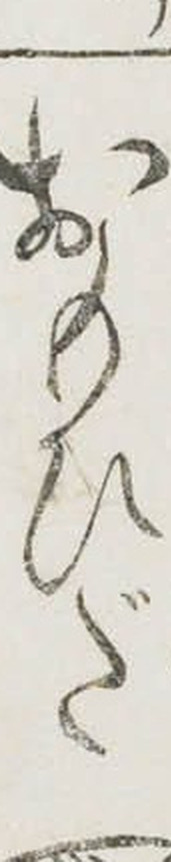おもひだ
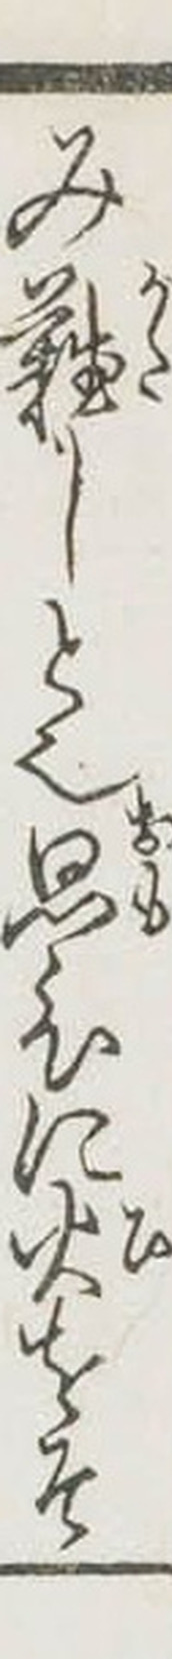み難しと也思ひに火をそ
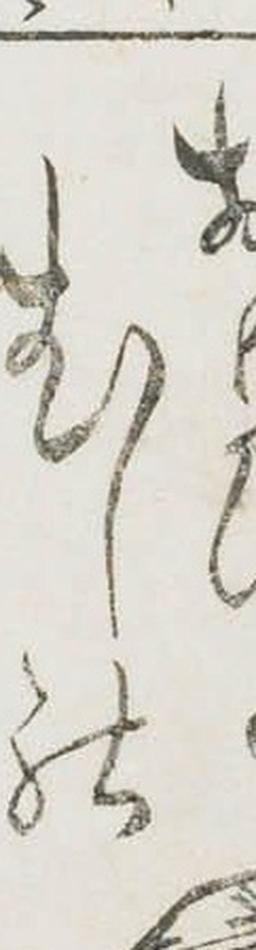むしの
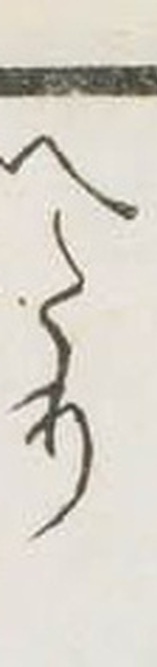へたり
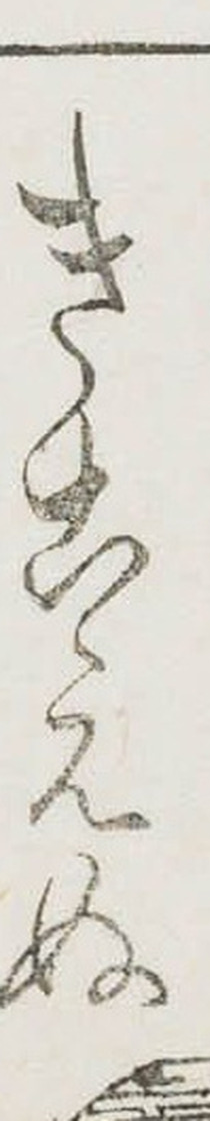きこえぬ
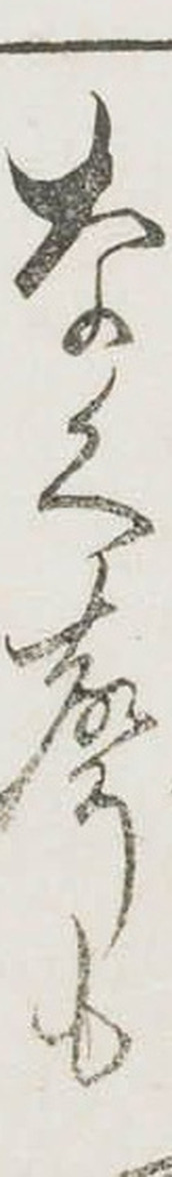なく声も
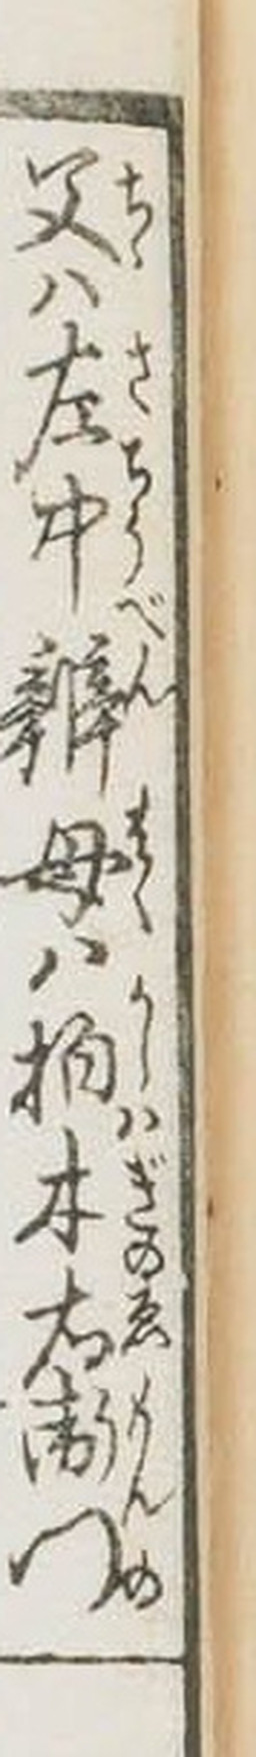父は左中弁母は柏木右衛門
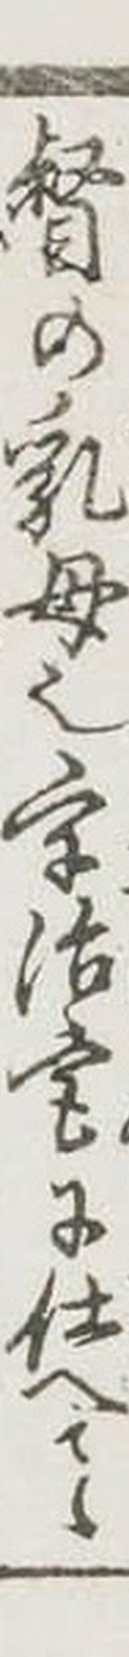督の乳母也宇治宮に仕へて
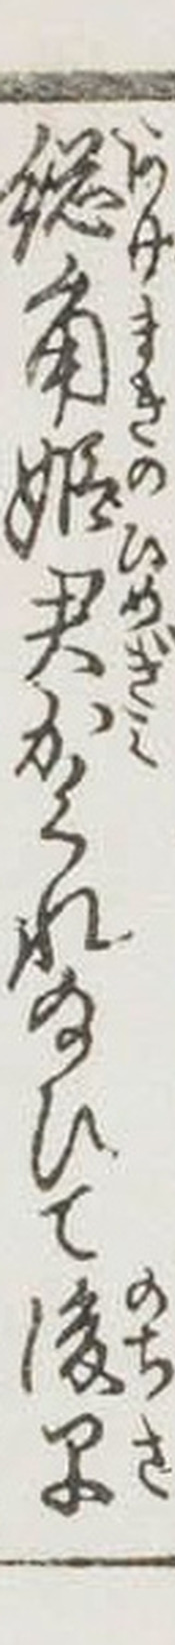総角姫君かくれ給ひて後早
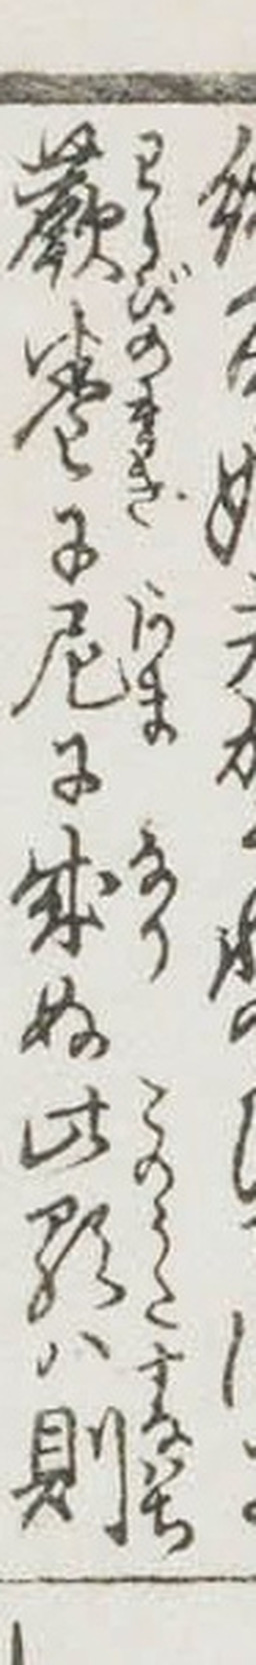蕨巻に尼に成ぬ此歌は則
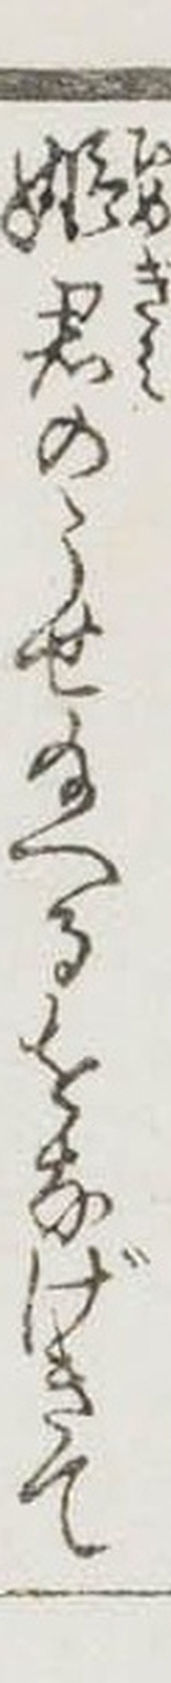姫君のうせ給へるをなげきて
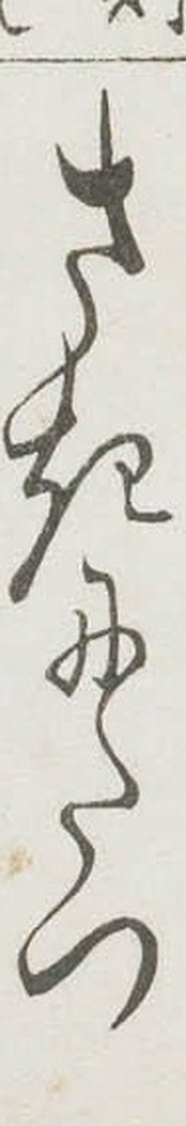さきにたつ
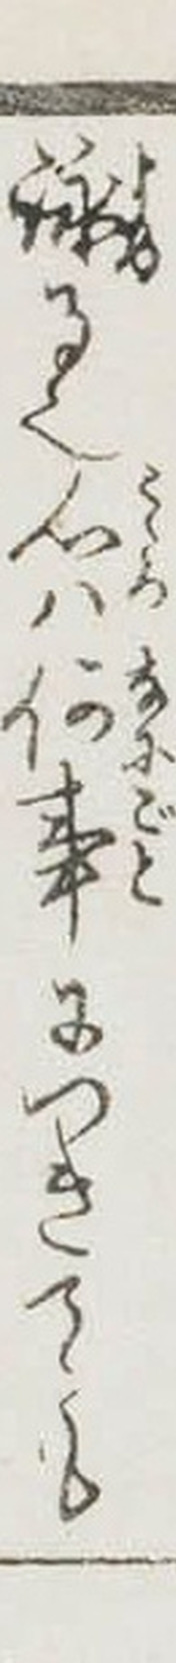詠る也心は何事につきても
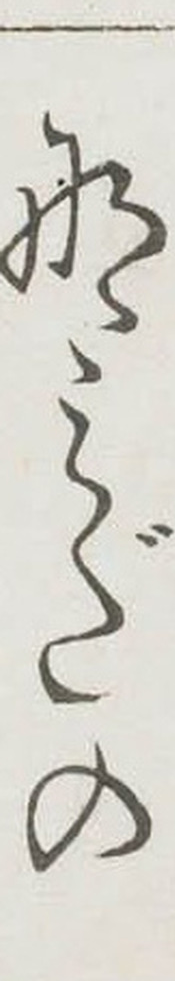なみだの
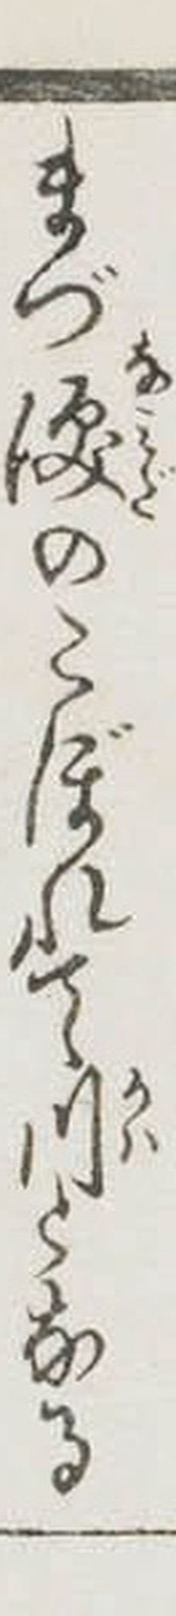まづ涙のこぼれて川となる
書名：源氏百人一首
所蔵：東京学芸大学教育コンテンツアーカイブ
